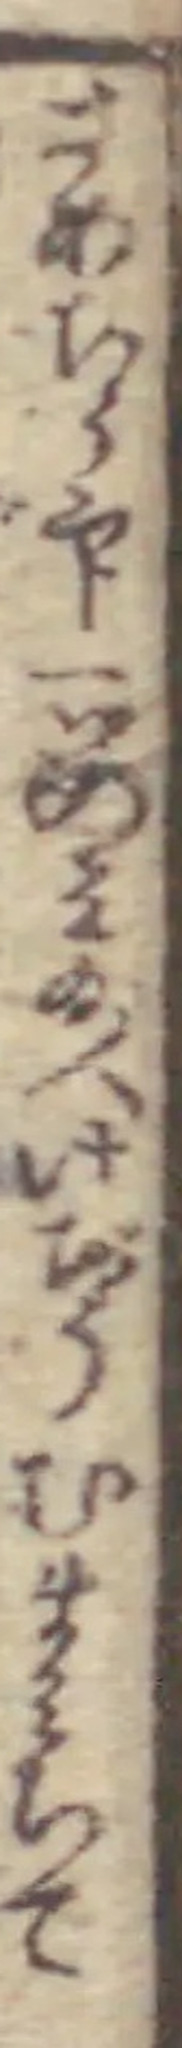さめちう印一つのみ給へ此ぢうむまみちて
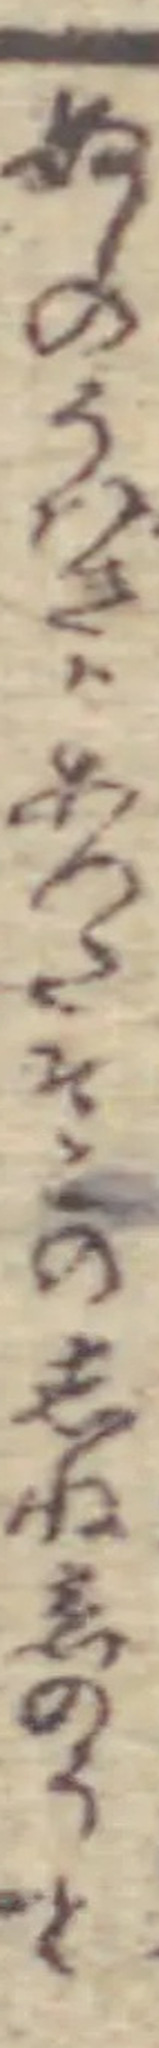ぬしのうはさかあつたそこのしねしのうと
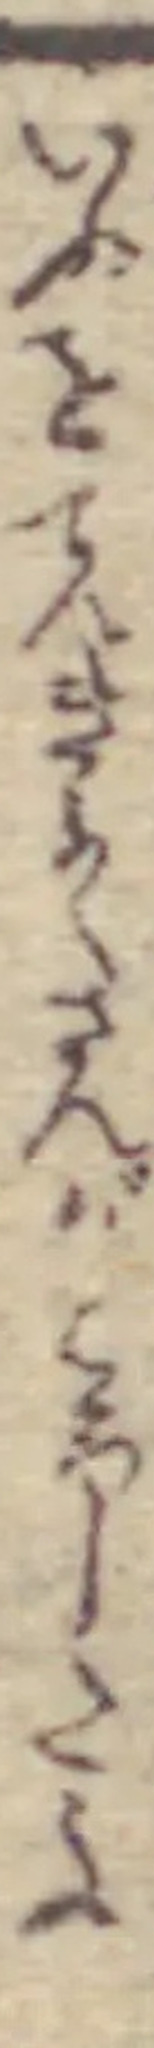いふをてんきよくさんがころしたよ
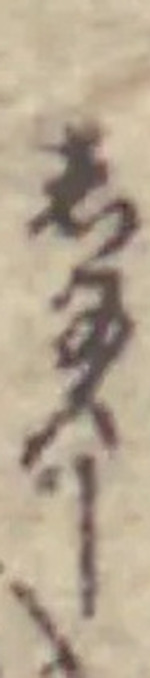しなんし
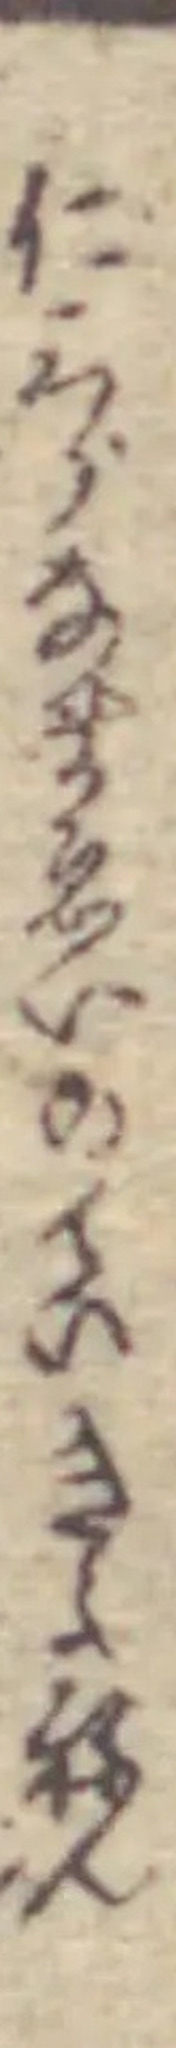仁三郎なまゑいのていきよねん
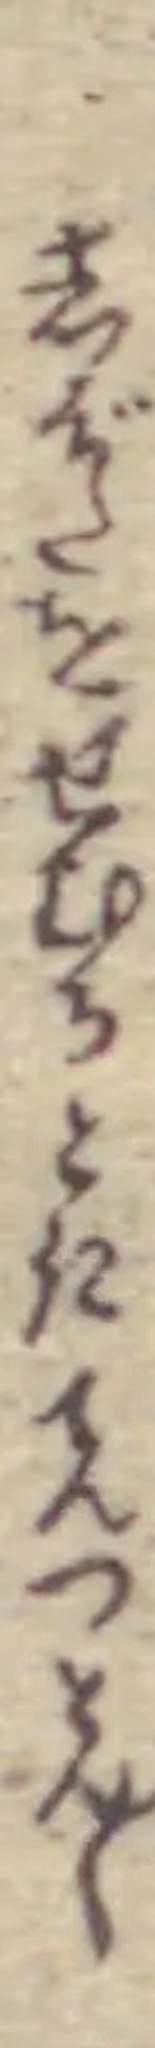しばたをせむるときてんつとん〳〵
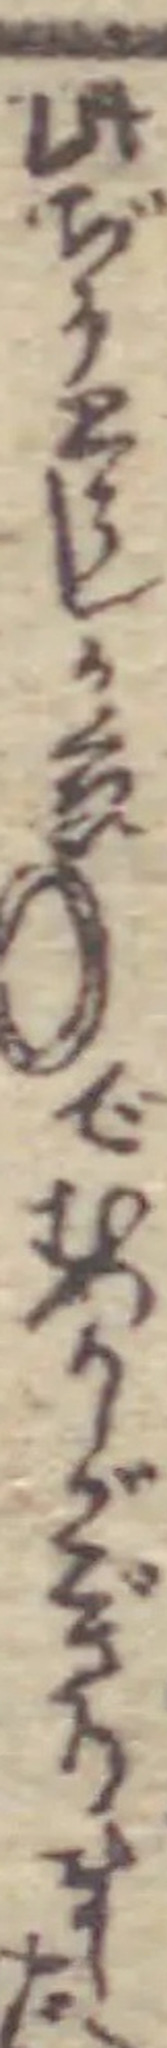此ぢうとうしがくはいでむつかしがござりました
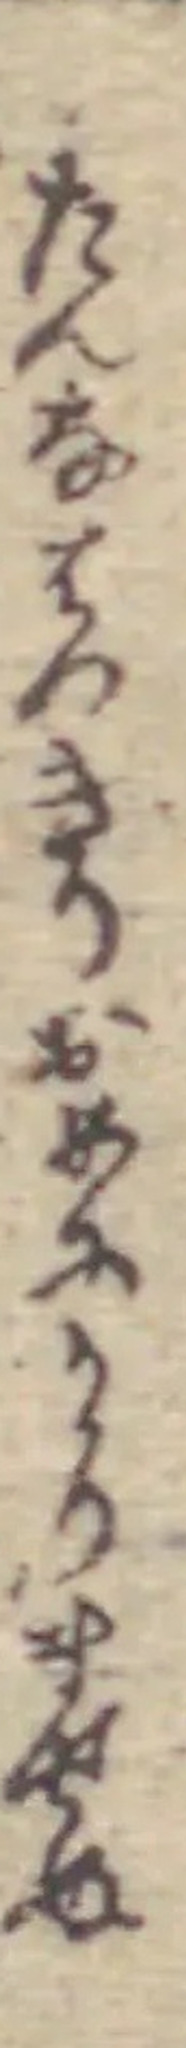たんなはつきりおめにかゝりませぬ
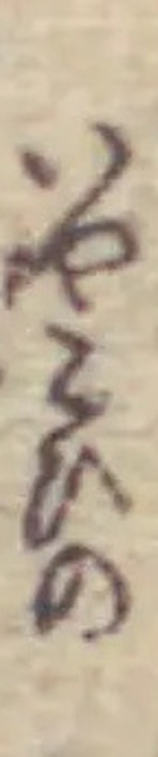いやこひの
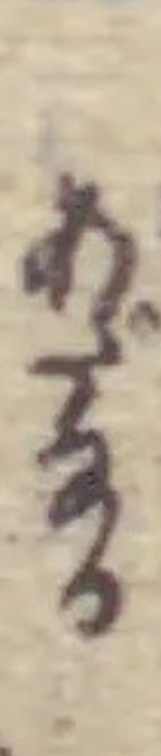あだなる
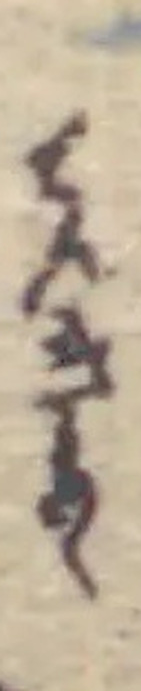てんきよく
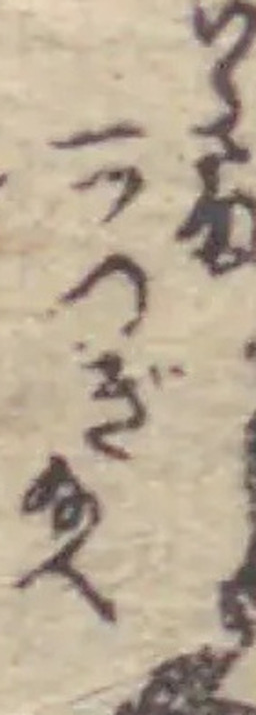一つつぎ給へ
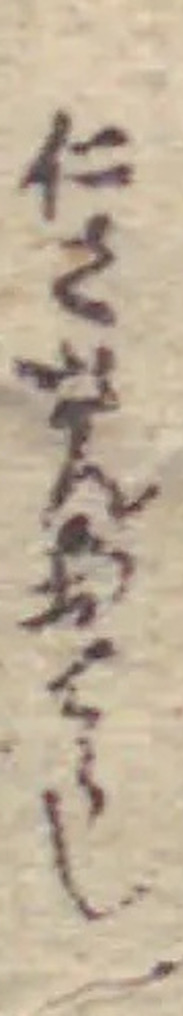仁ささんおてらし

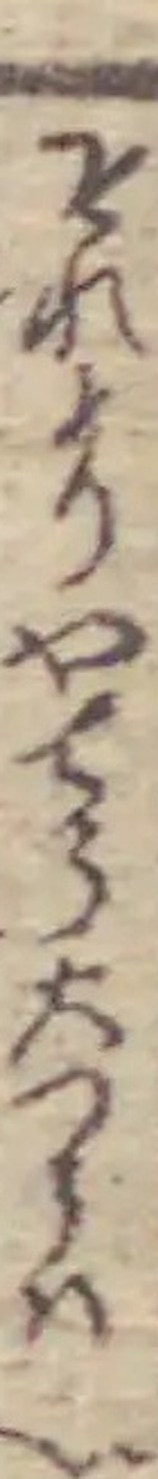それよりやてう大つうは
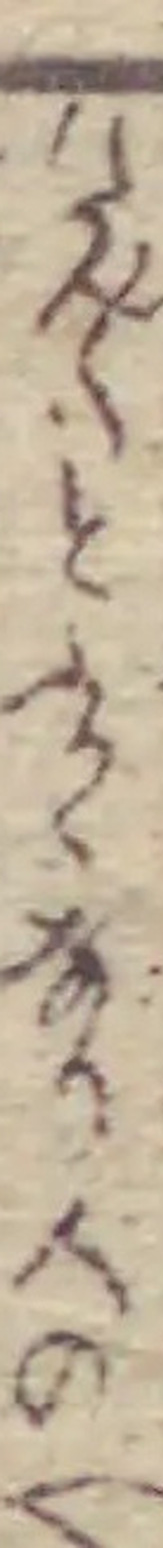たん〳〵とふかくなり人の
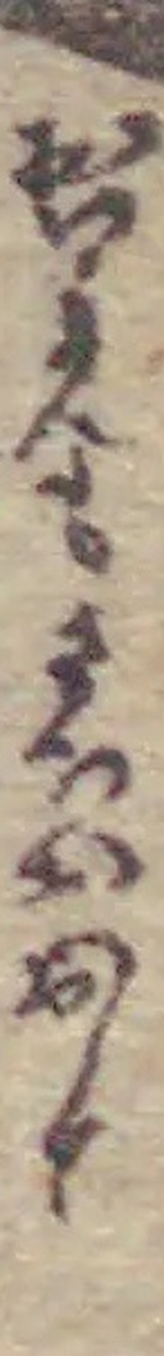おいらんもさほおおして
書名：夜野中狐物 2巻
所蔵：国立国会図書館 National Diet Library, JAPAN
